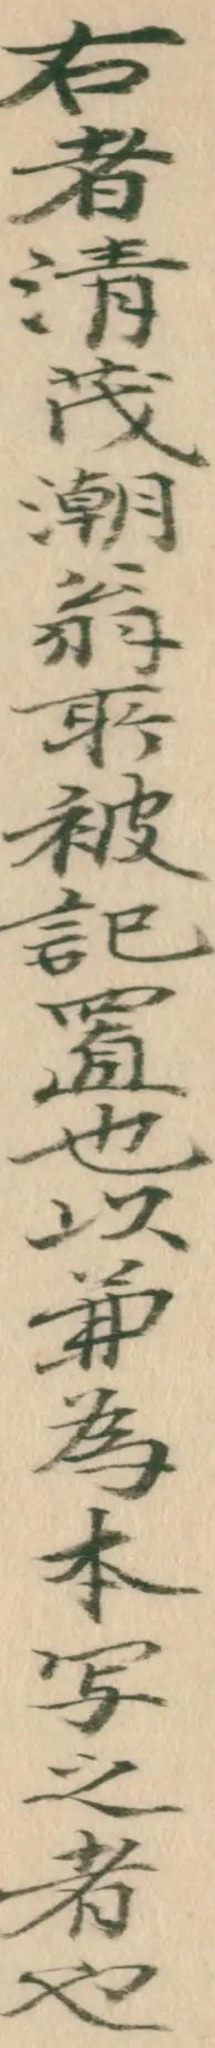右者清茂潮翁所被記置也以兼為本写之者也

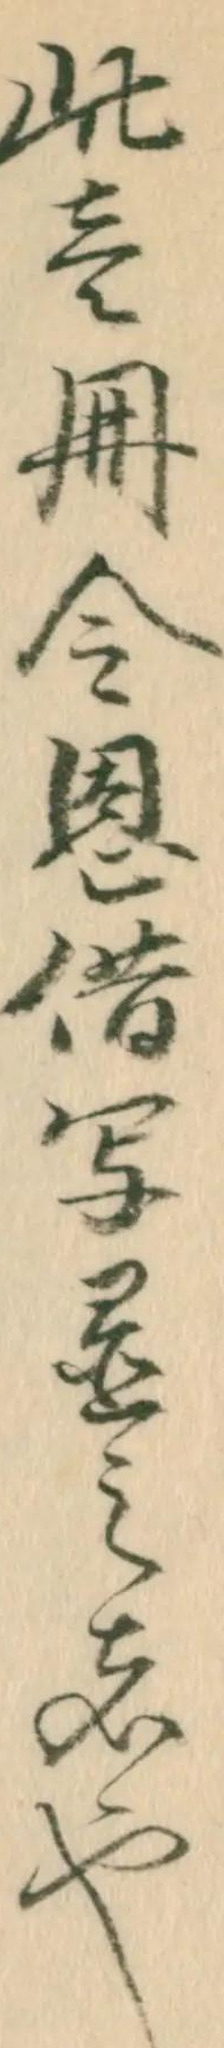此壱冊令恩借写置之者也
